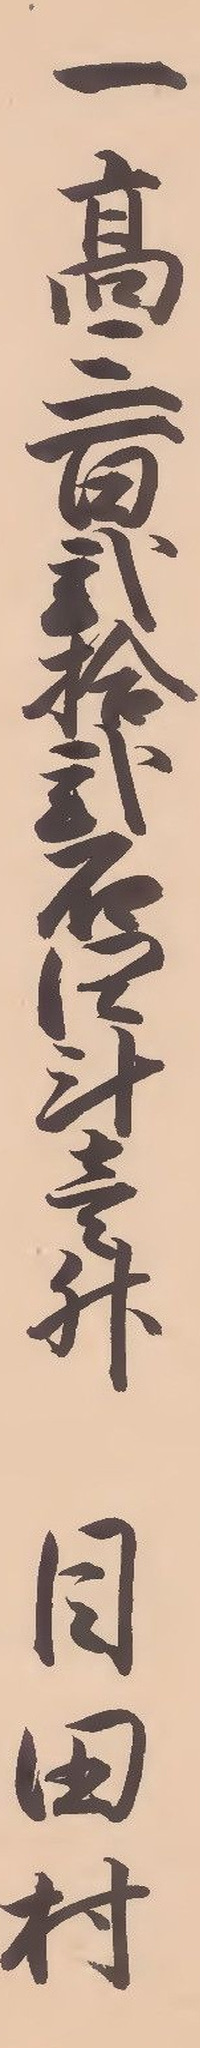一高三百弐拾弐石四斗壱升目田村
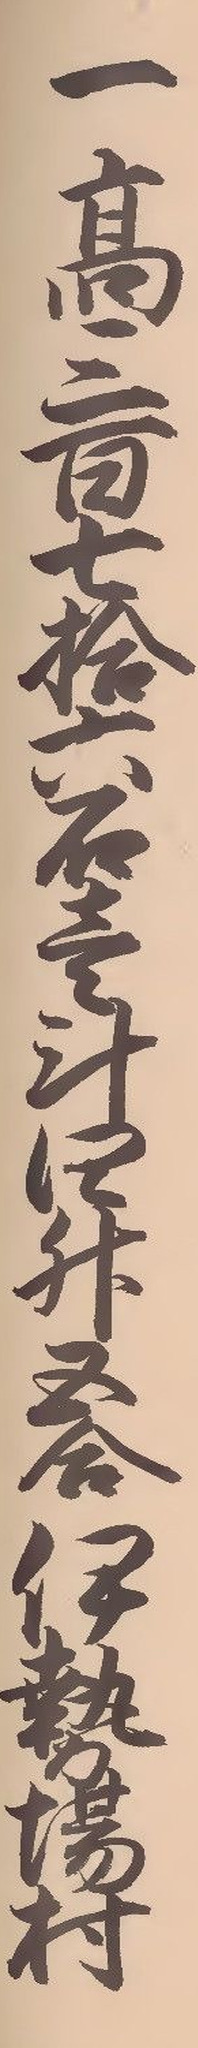一高三百七拾六石壱斗四升五合伊勢場村
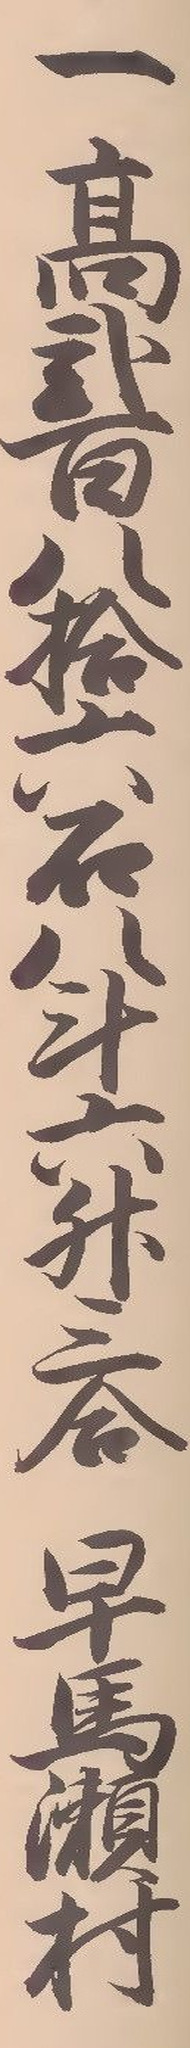一高弐百八拾六石八斗六升三合早馬瀬村
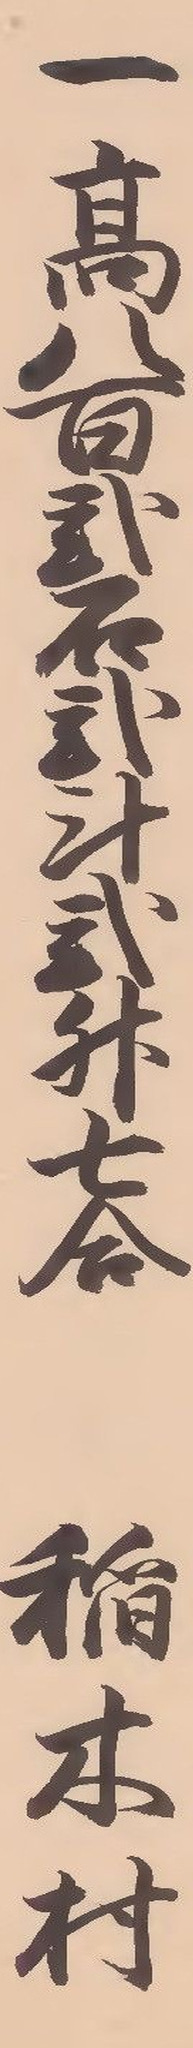一高八百弐石弐斗弐升七合稲木村
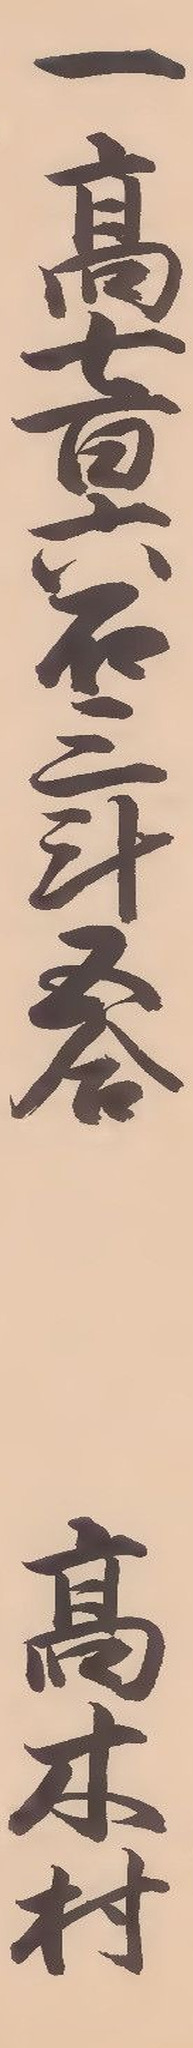一高七百六石三斗五合高木村
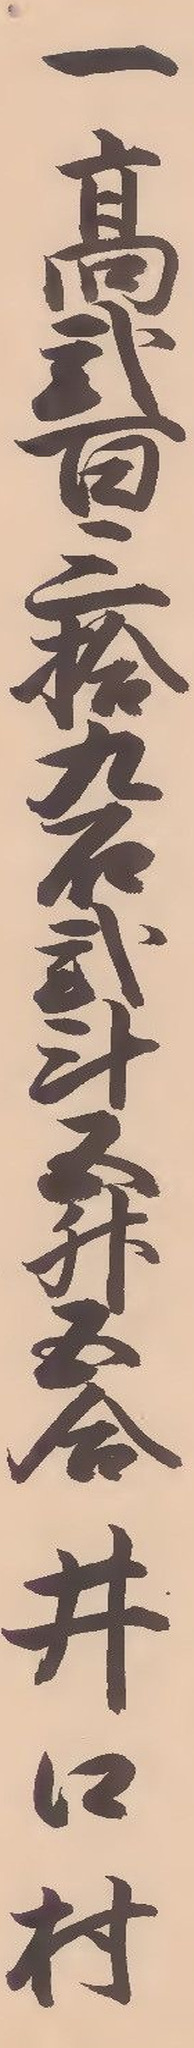一高弐百三拾九石弐斗五升五合井口村

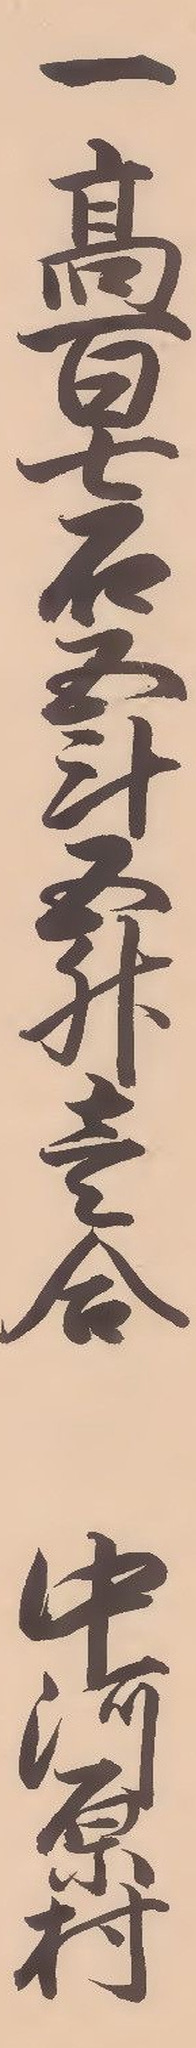一高百七石五斗五升壱合中河原村
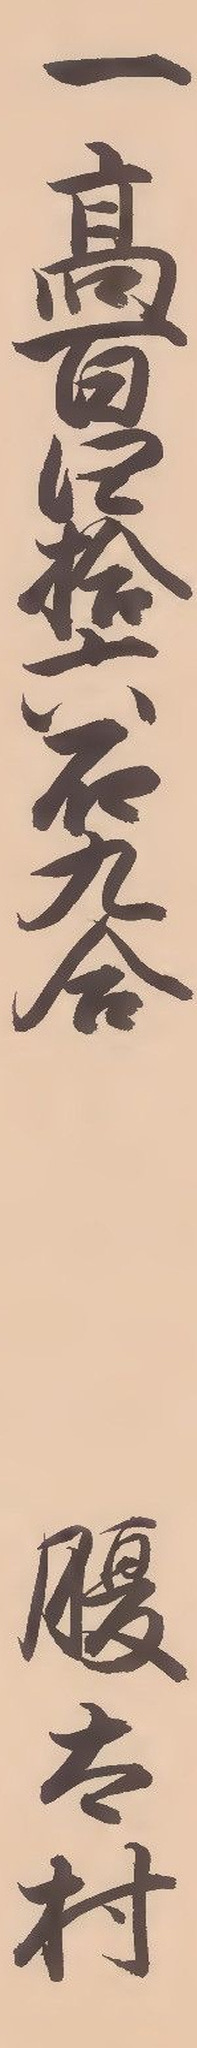一高百四拾六石九合腹太村
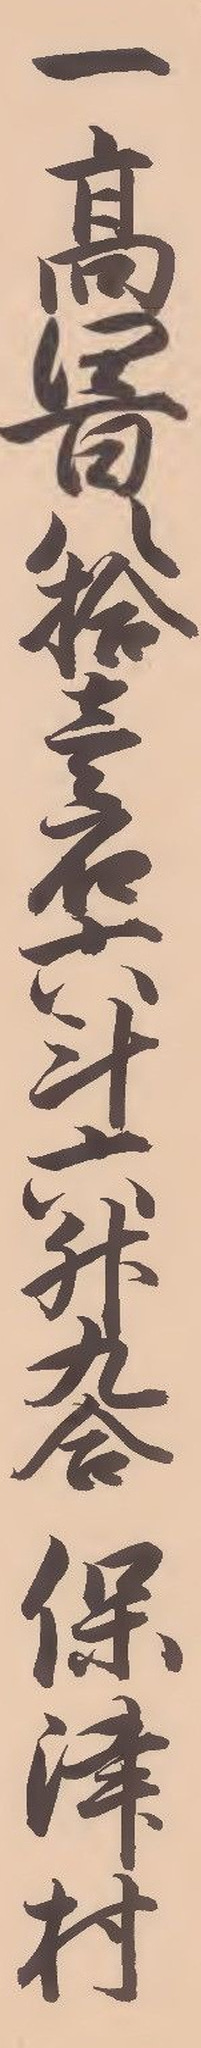一高四百八拾壱石六斗六升九合保津村
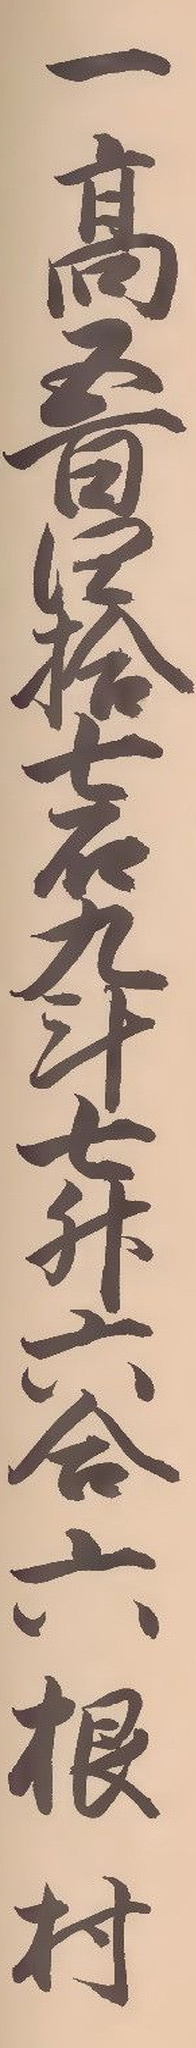一高五百四拾七石九斗七升六合六根村
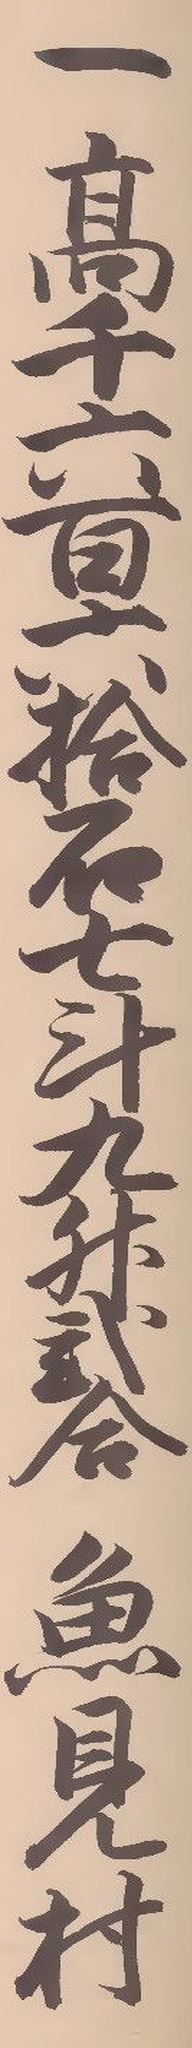一高千六百六拾石七斗九升弐合魚見村
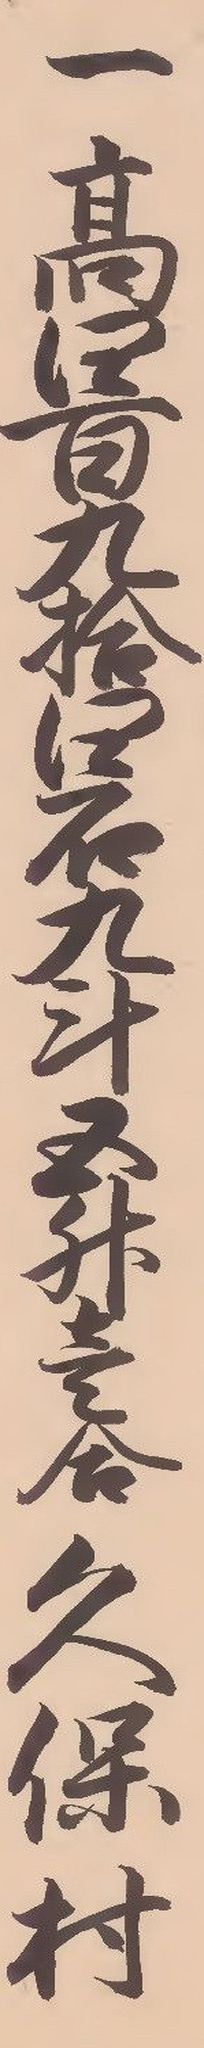一高四百九拾四石九斗五升壱合久保村
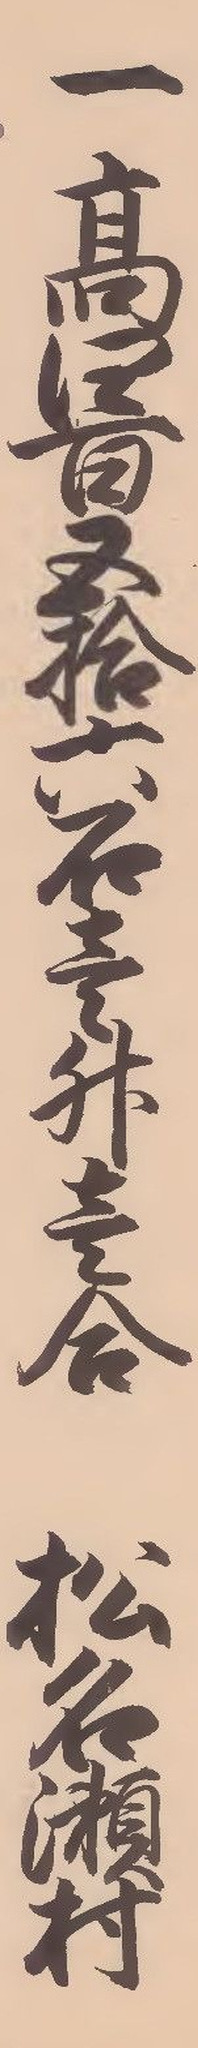一高四百五拾六石壱升壱合松名瀬村
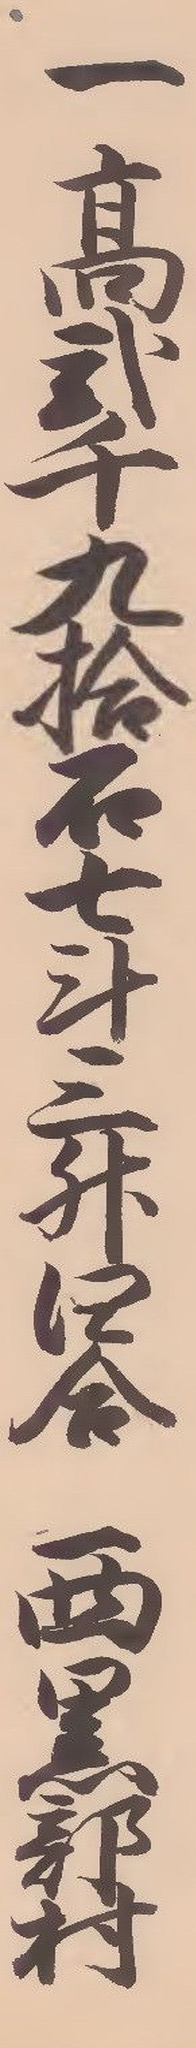一高弐千九拾石七斗三升四合西黒部村

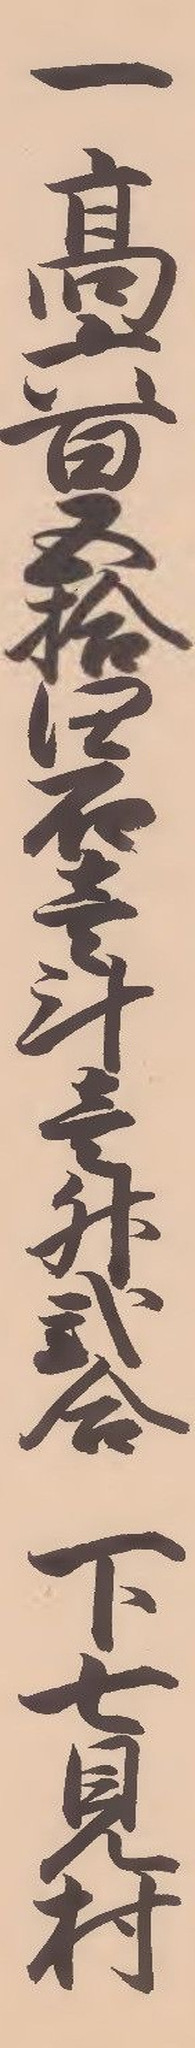一高六百五拾四石壱斗壱升弐合下七見村
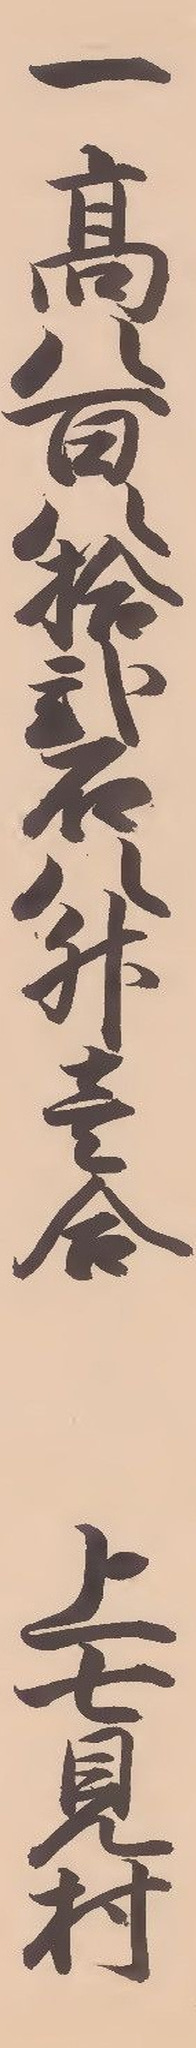一高八百八拾弐石八升壱合上七見村
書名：伊勢国郷帳
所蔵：国立公文書館 National Archives of Japan
